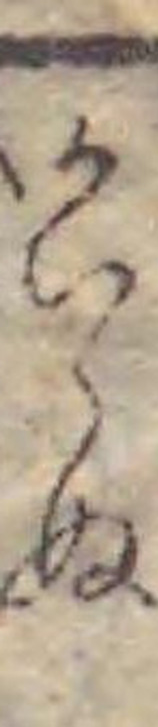かいらぬ
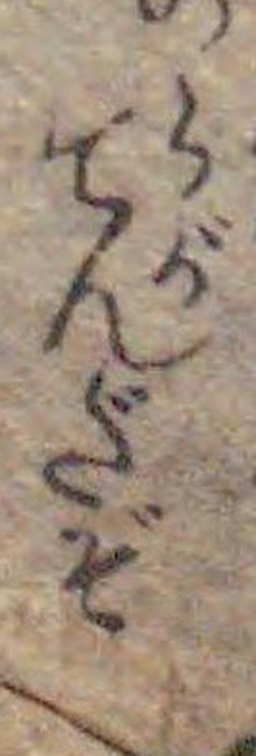てんだぞ
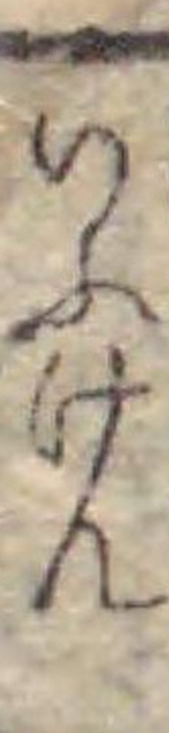いふけん
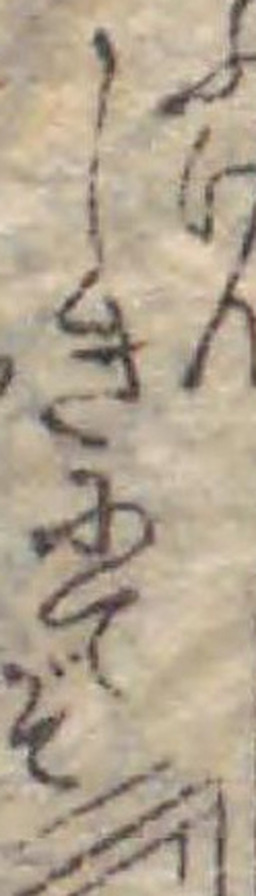しきにてぞ

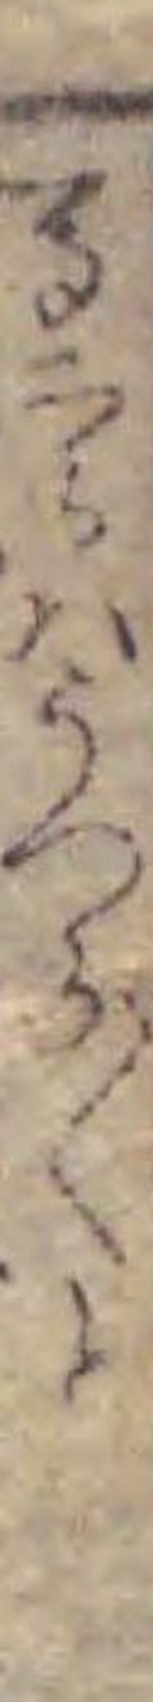馬二郎はうつら〳〵と
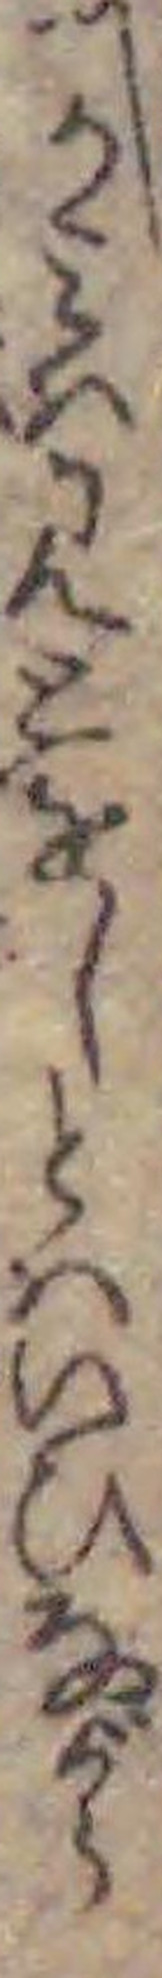〽かみは見とをしとはいひながら
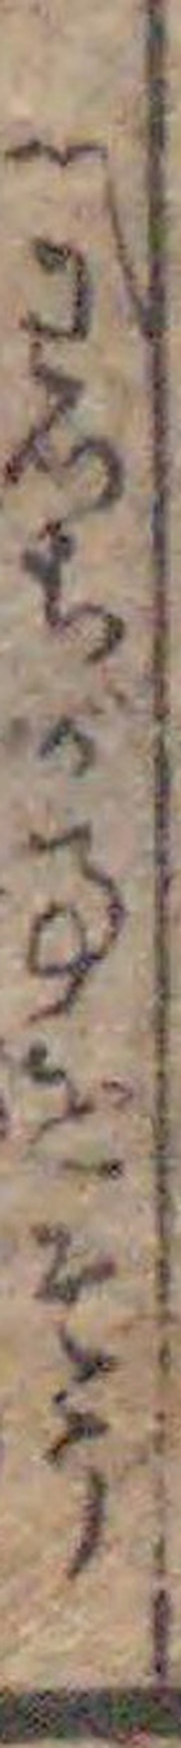〽わつちが事をそう
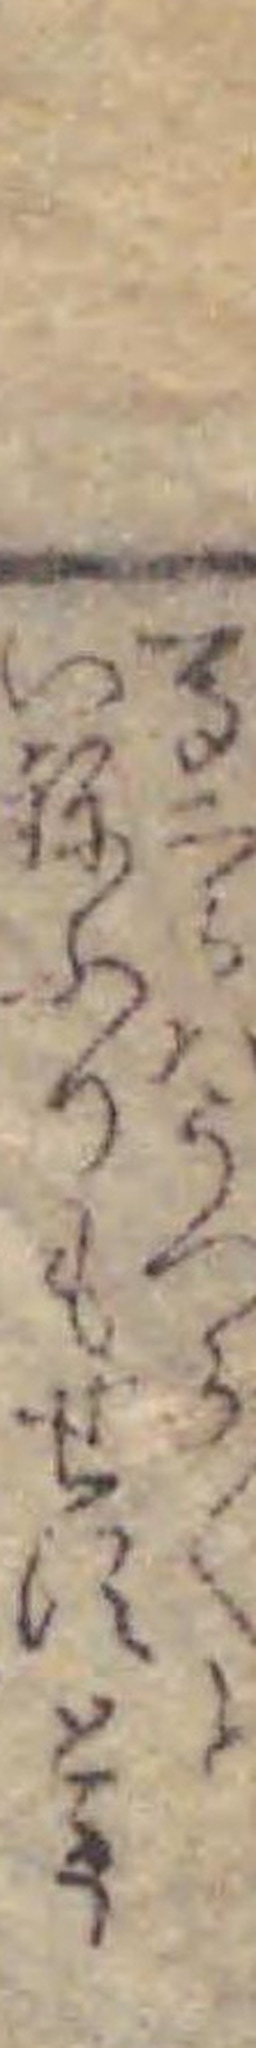いねふりもせすとう
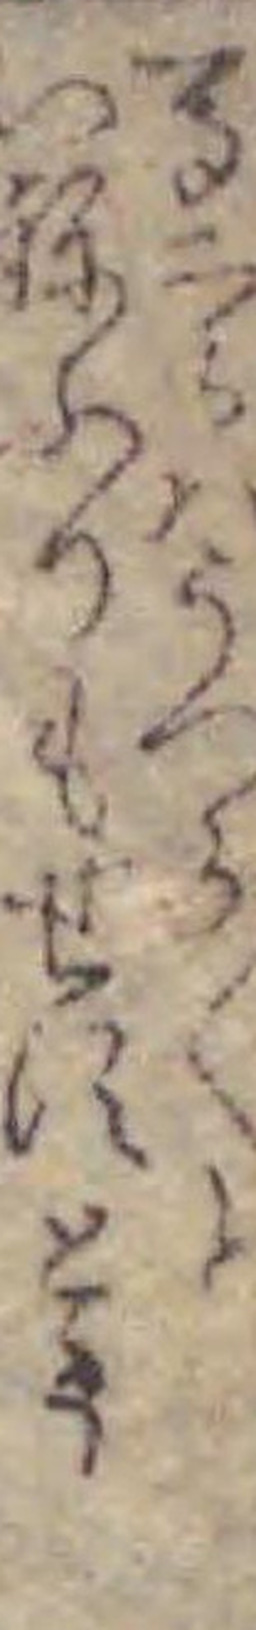いねふりもせすとう
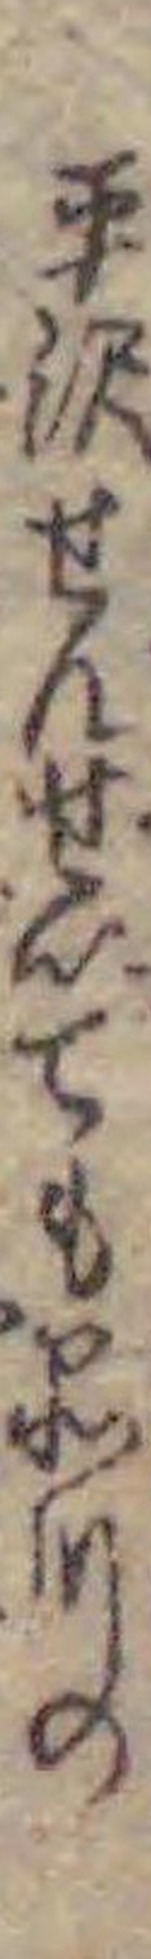平沢せんせいでも品川の
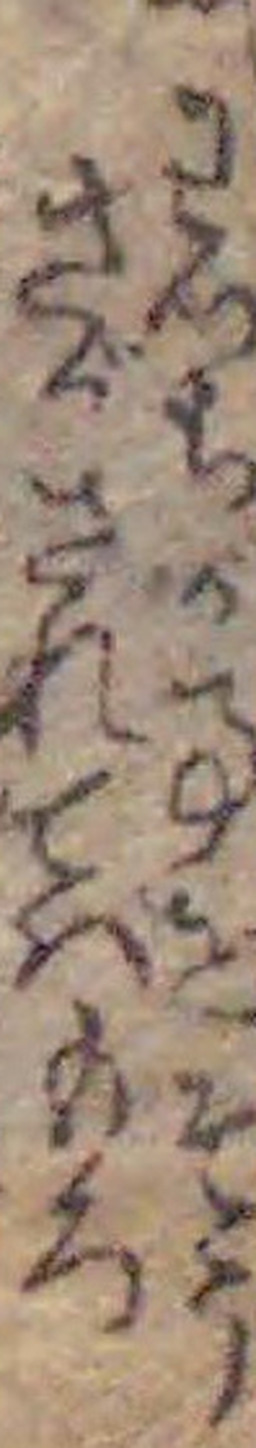さがされてはもろ
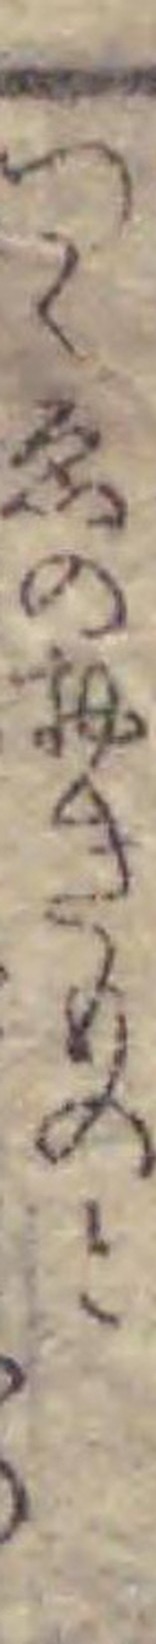つくゑのおきものと
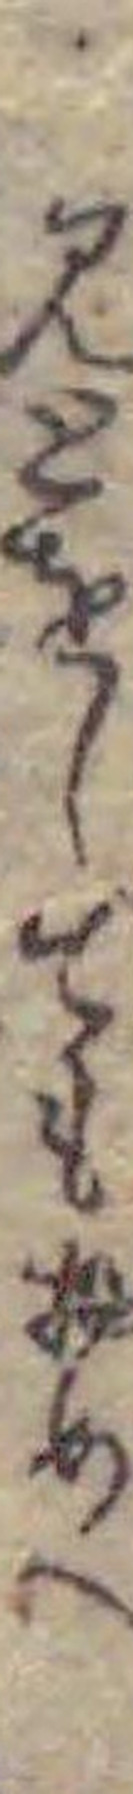見とをしでもおめへ
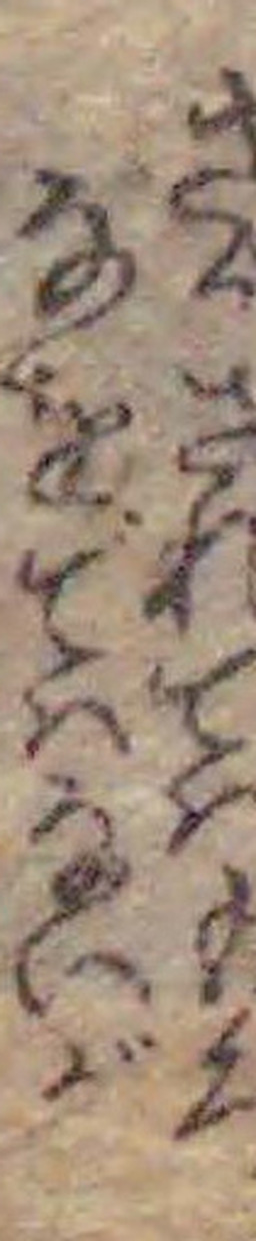なをではないが
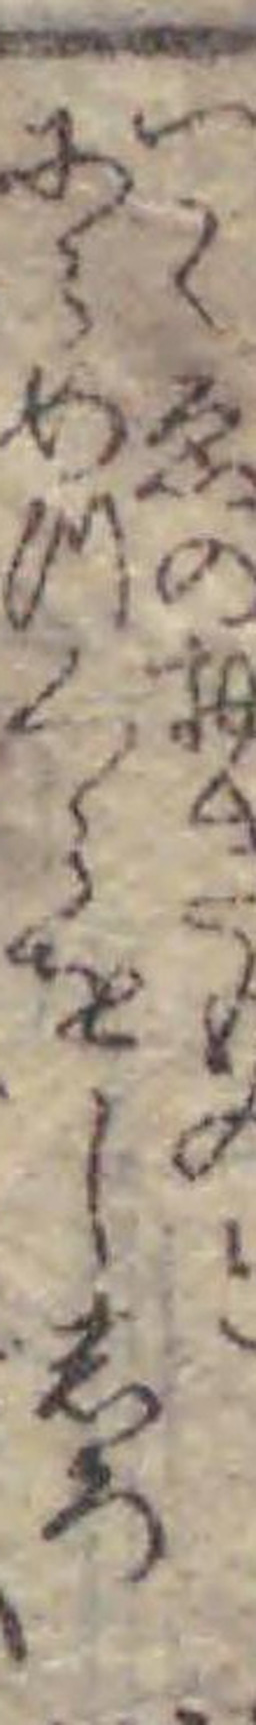にらめつくらをししろ
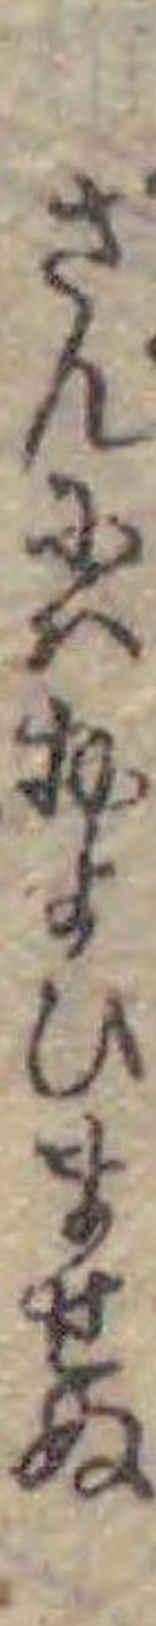さんにはおよひませぬ
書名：人間一心覗替繰 : 2巻
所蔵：国立国会図書館 National Diet Library, JAPAN
